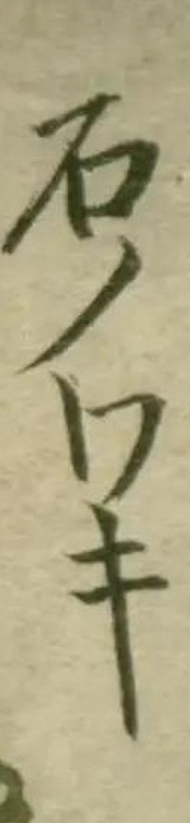石ノワキ
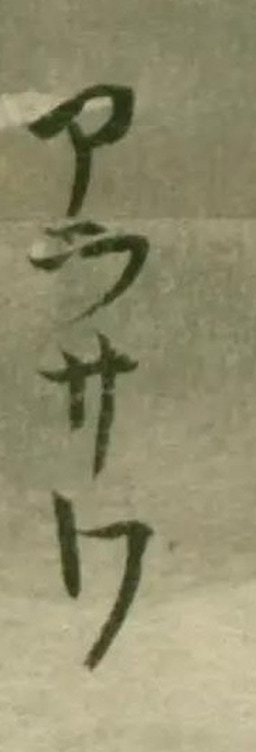アラサワ
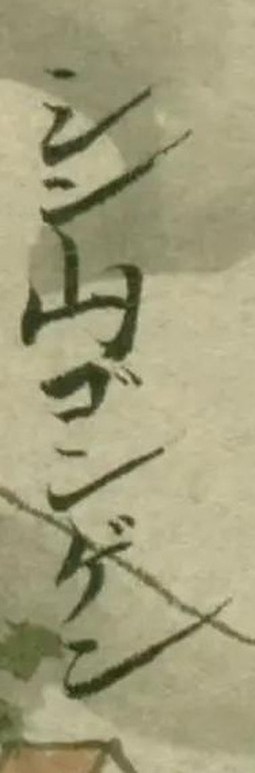シン山ゴンゲン
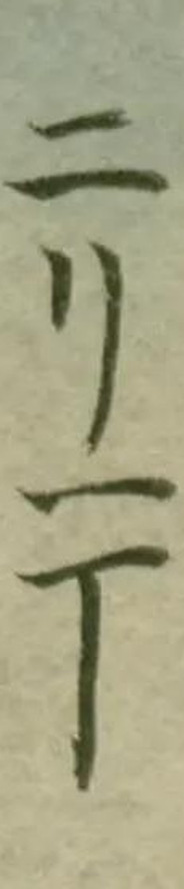二リ一丁
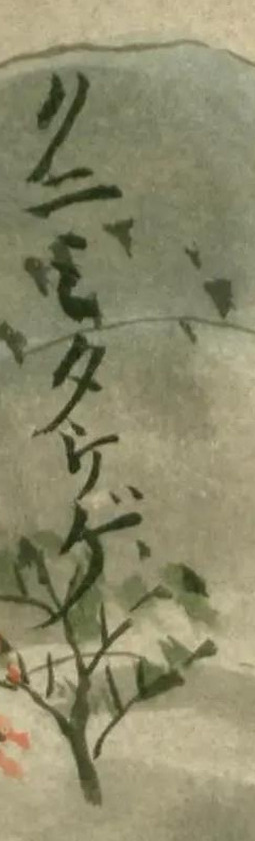クニミタウゲ
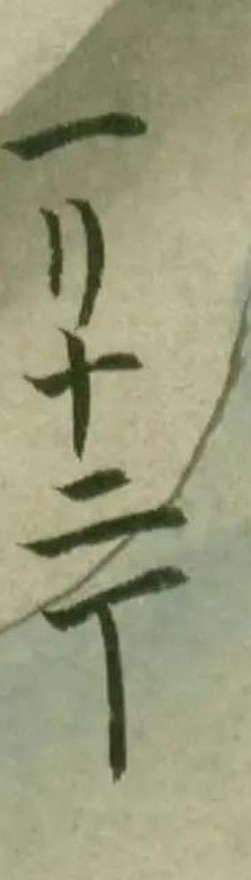一リ十二丁
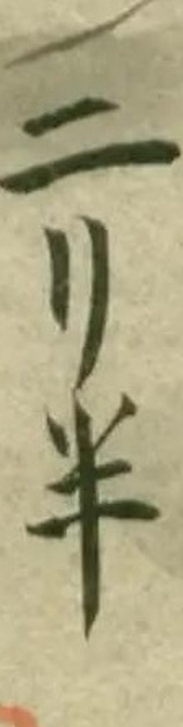二リ半
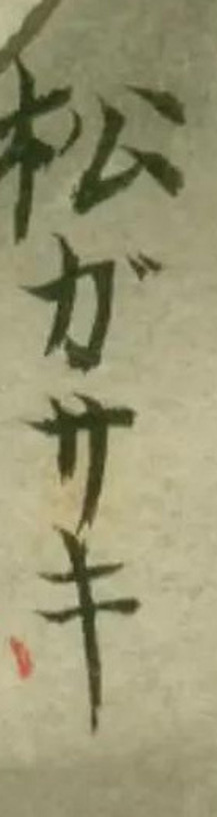松ガサキ
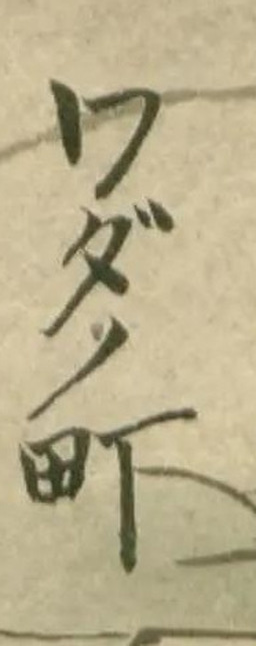ワダノ町
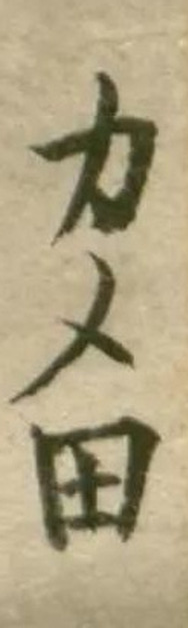カメ田
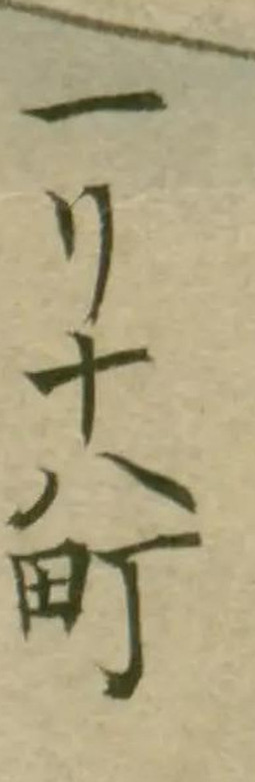一リ十八町
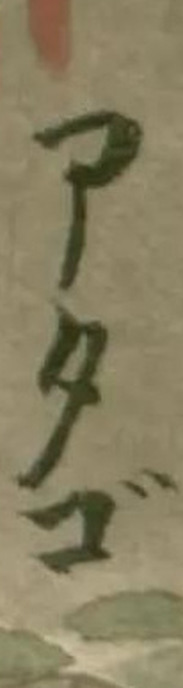アタゴ
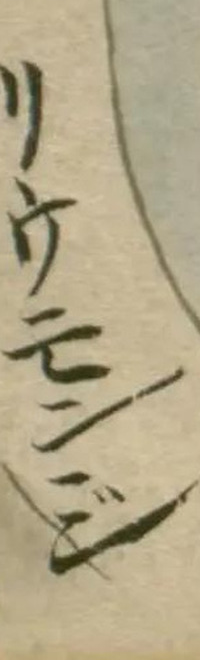リウモンジ

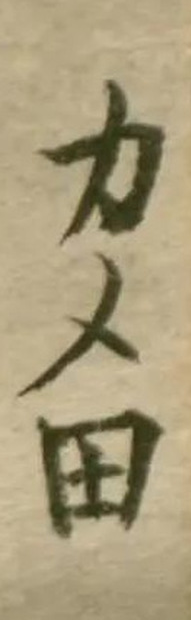カメ田
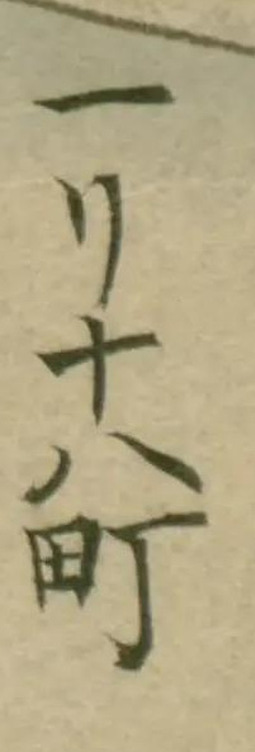一リ十八町
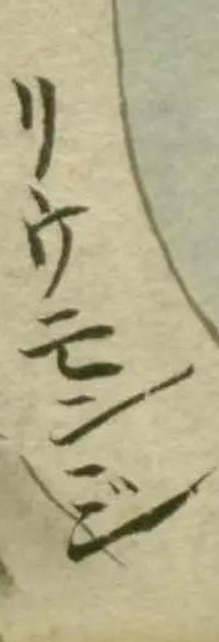リウモンジ
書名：江戸より奥州津輕迄道筋之圖
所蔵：国立国会図書館 National Diet Library, JAPAN
